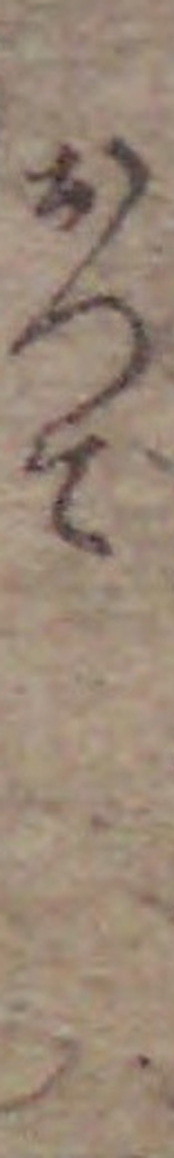おつて
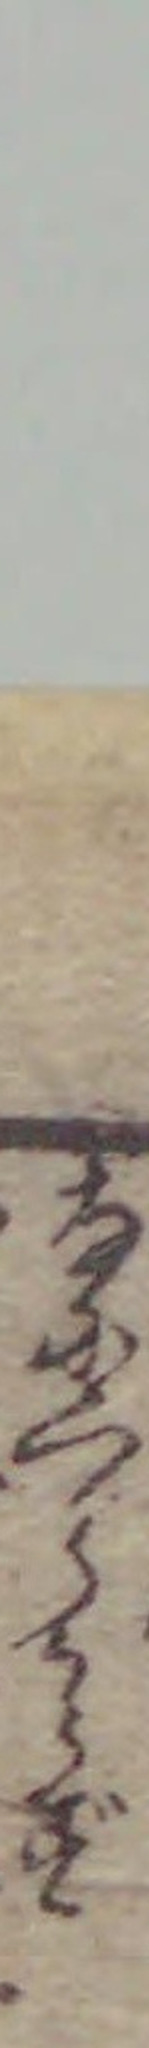なにくらからず
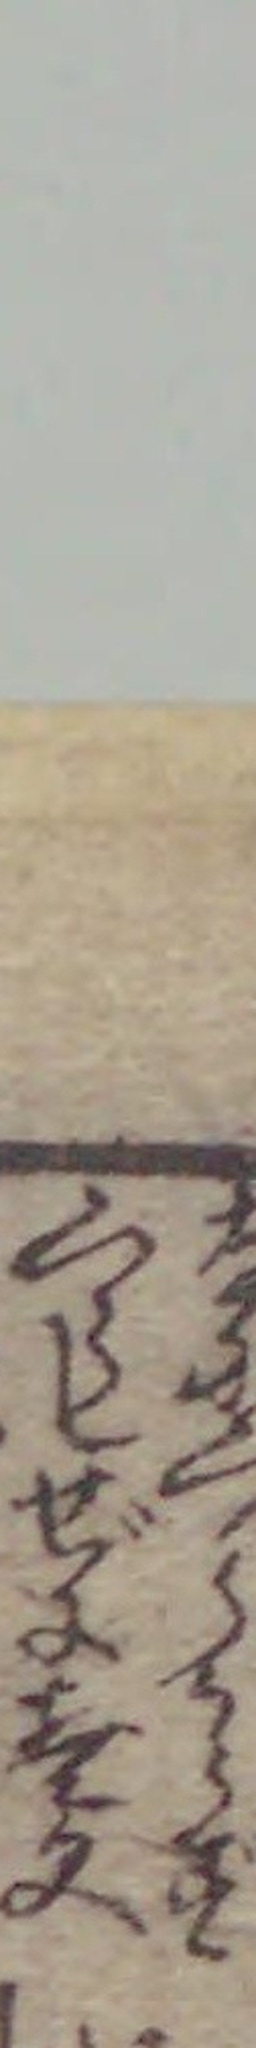くらしぜに壱文
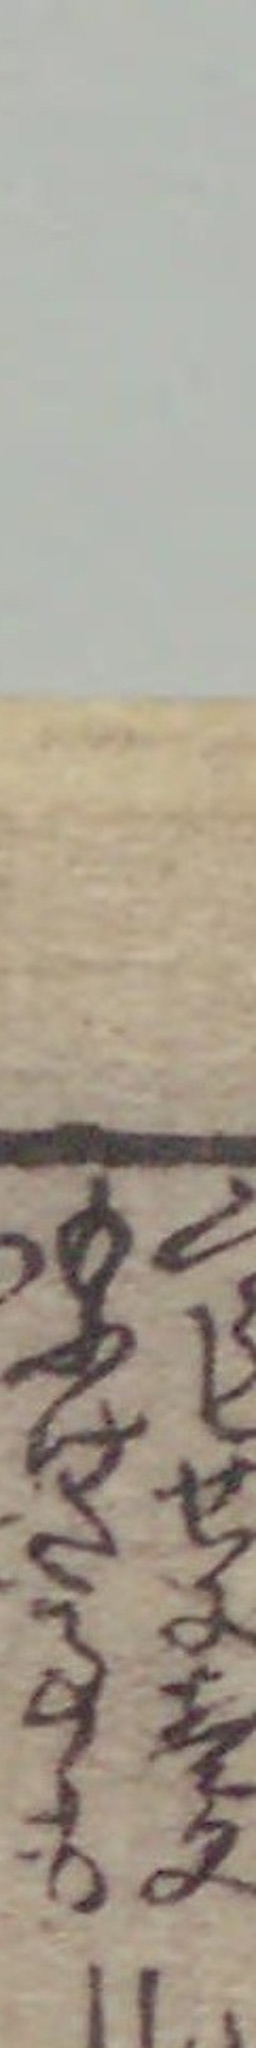もふけた事も
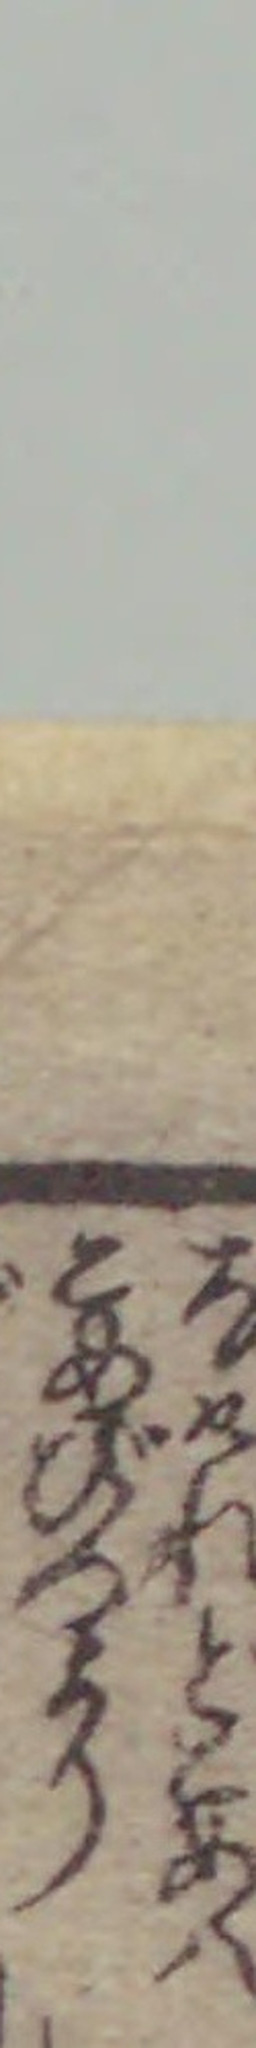こめびつより
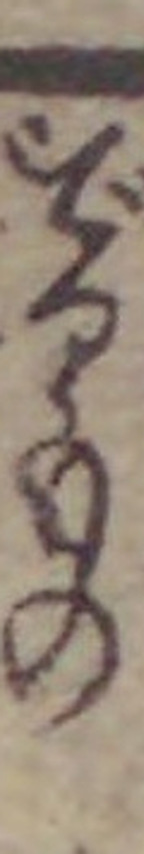でるもの
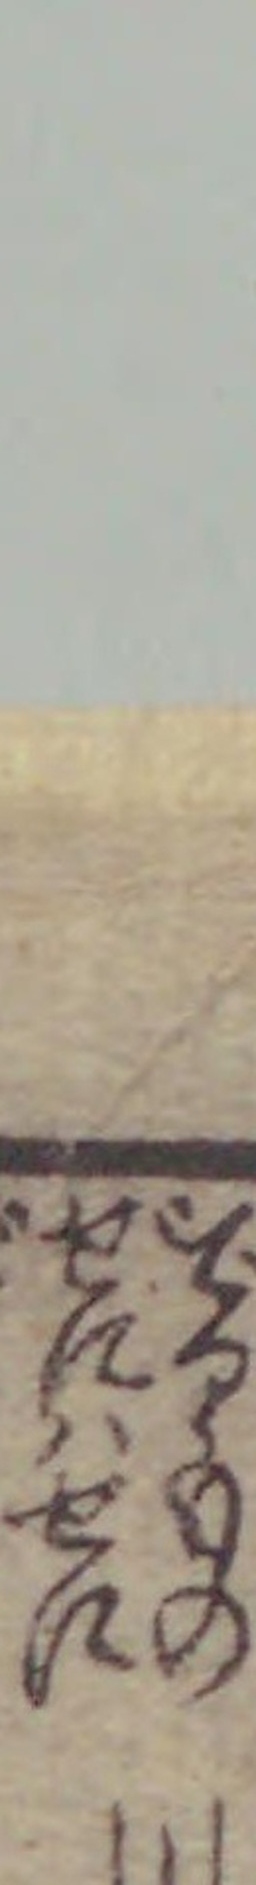ぜにはぜに
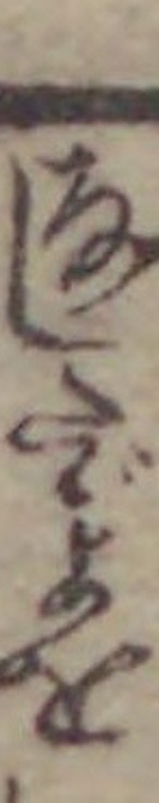なしたゞよを
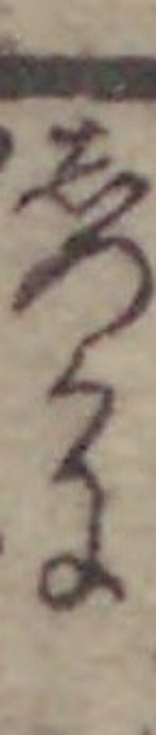しつかに
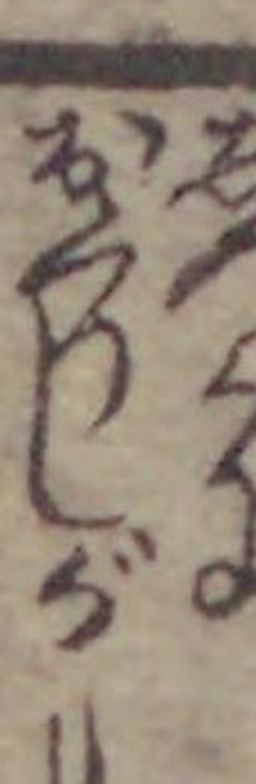おくりしが
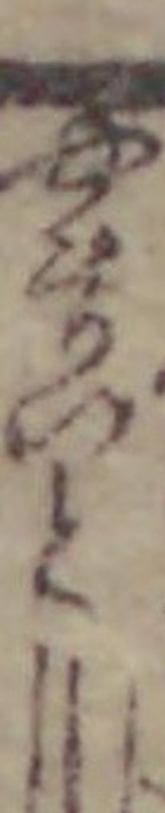やまいと
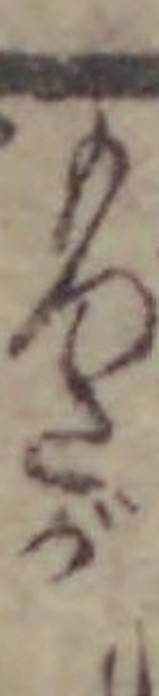もつたが
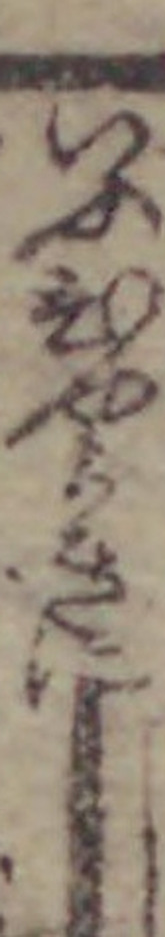いふひやうきに
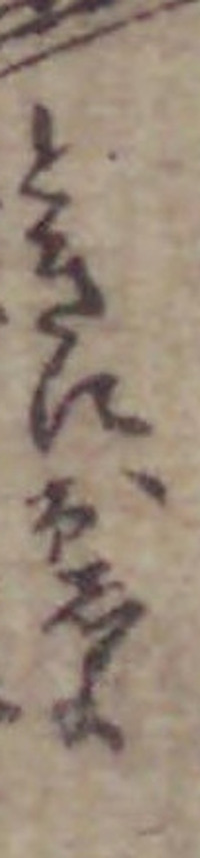ときにおしよ
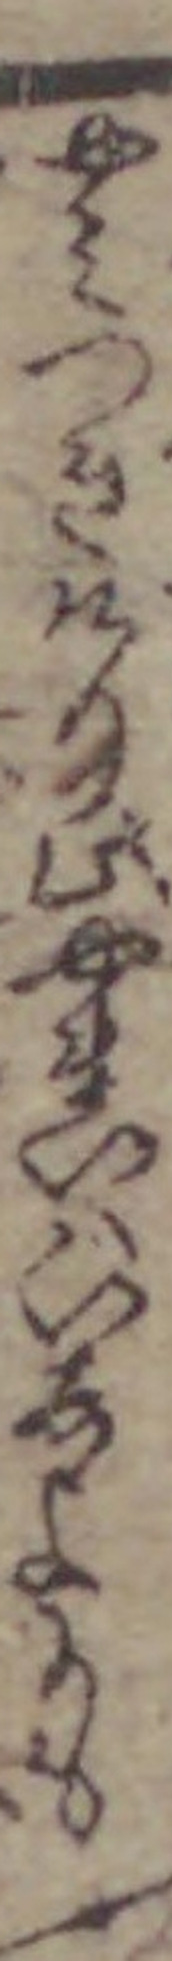やみつきけり此やまいはいしよりも
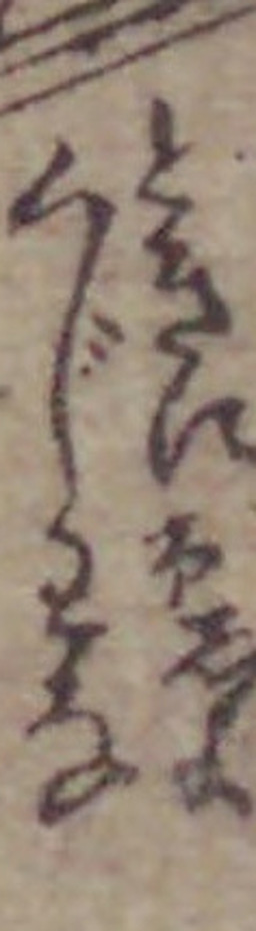くじわな
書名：御代の御寶
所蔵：国立国会図書館 National Diet Library, JAPAN
